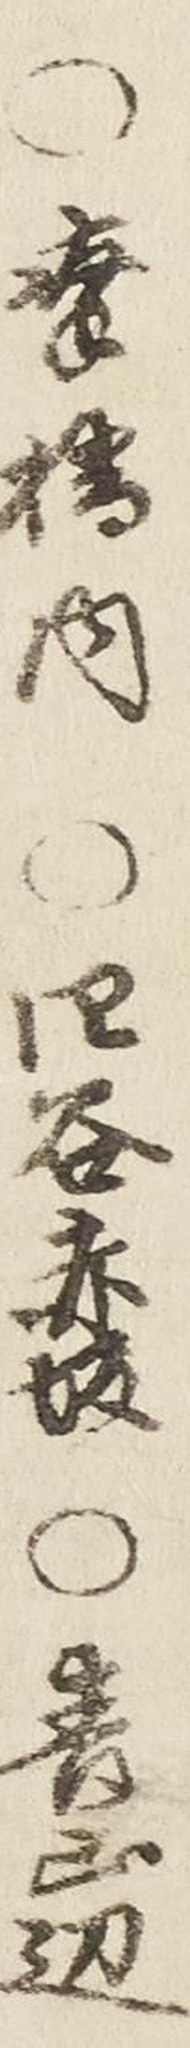○幸橋内○四谷赤坂○青山辺
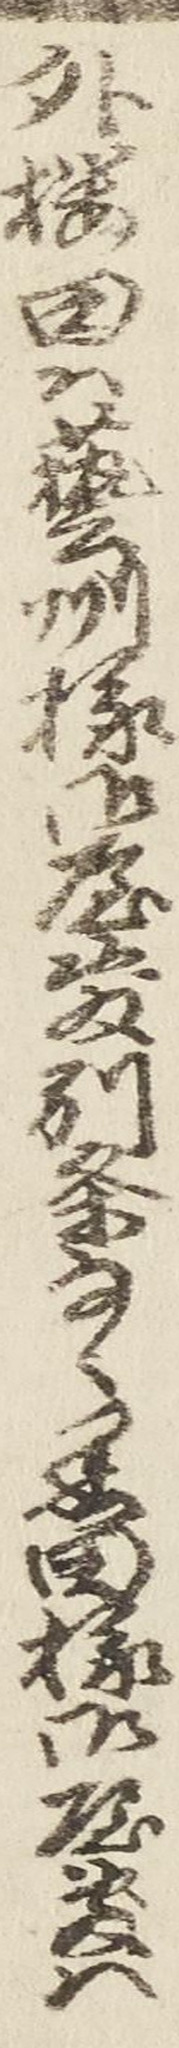外桜田は芸州様御屋敷別条なく黒田様御屋敷は
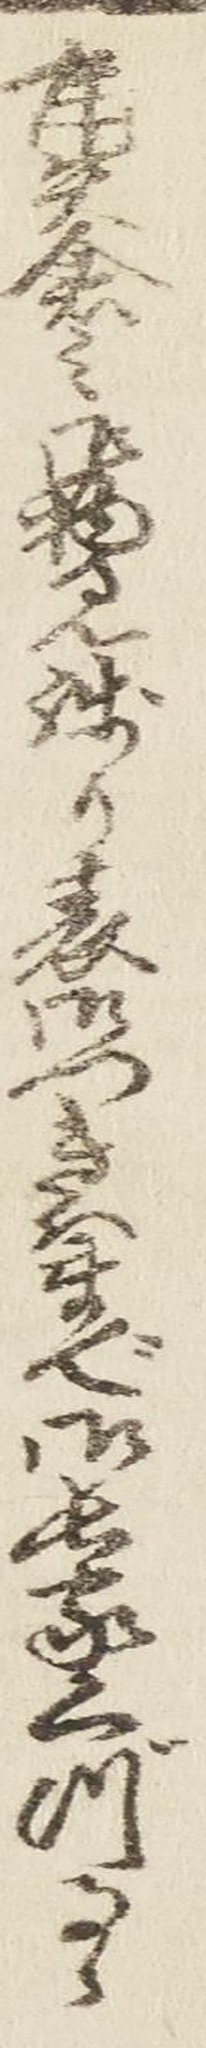角矢倉之御物見残り表御門きはまで御長家くづるゝ
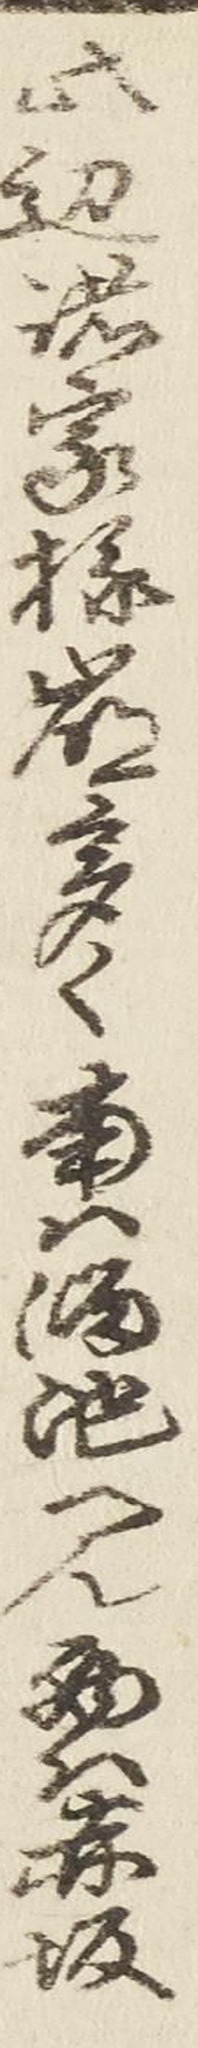此辺諸家様崩多く南は溜池へん西は赤坂
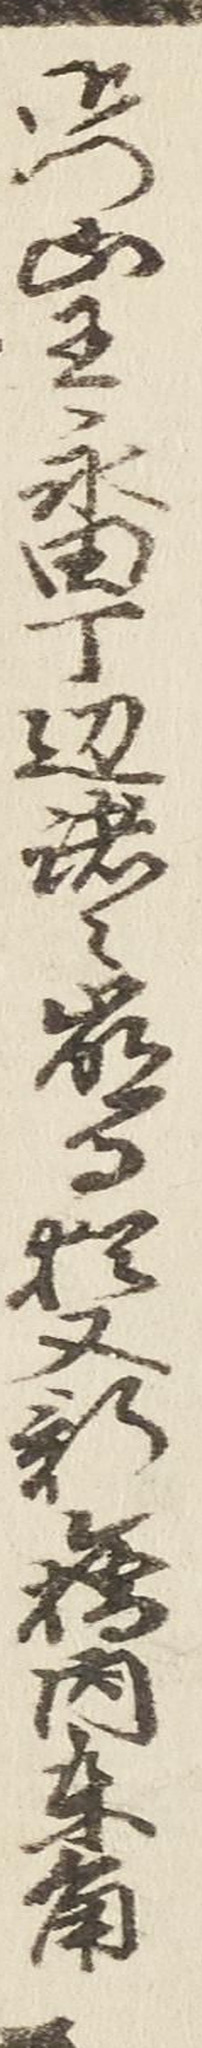御門山王永田丁辺諸々崩る猶又新シ橋内東角
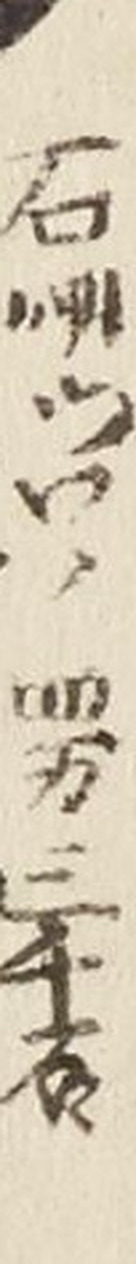石州ツワノ四万三千石
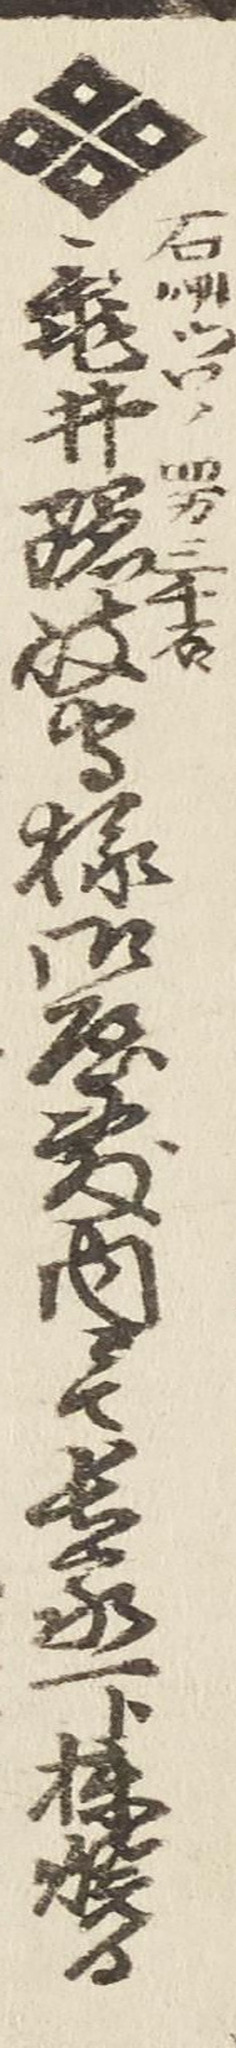亀井隠岐守様御屋敷内ニて長屋一ト棟焼る
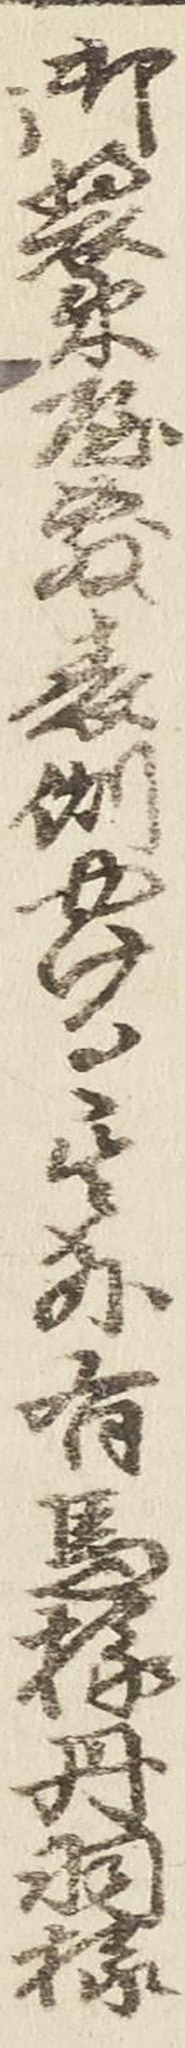御装束屋敷表側やける其外有馬様丹羽様
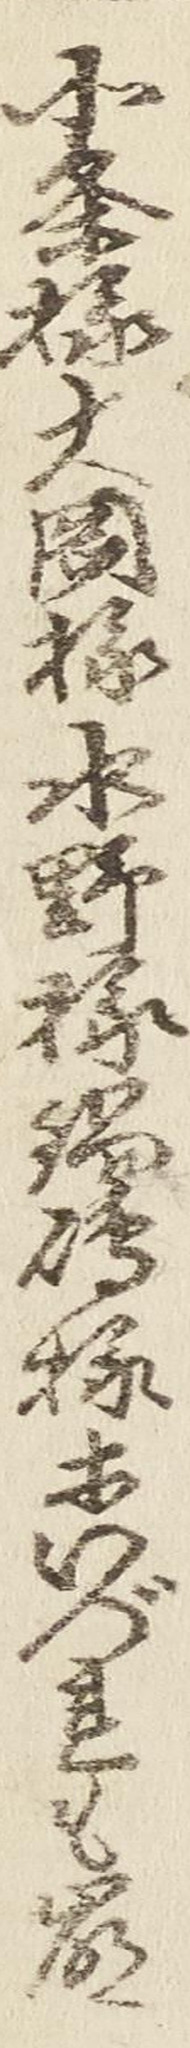北条様大岡様水野様鍋嶋様等いづれも崩
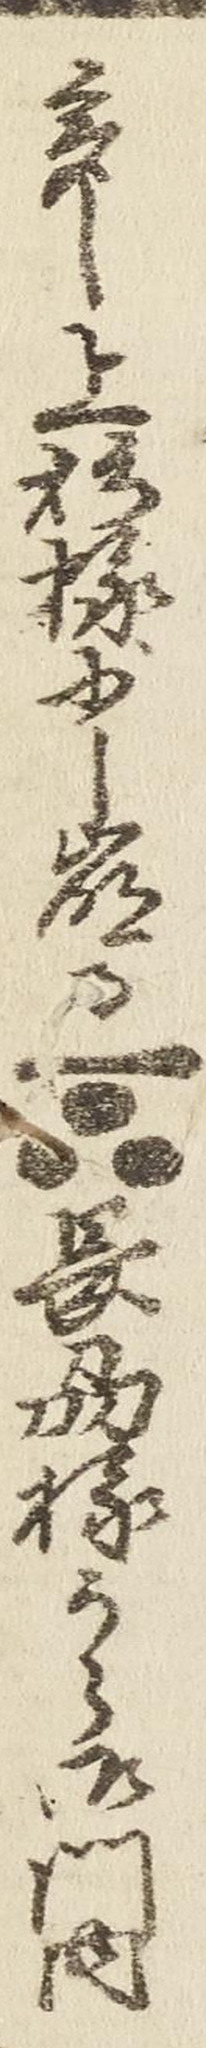多し上杉様少し崩る長州様うら御門内
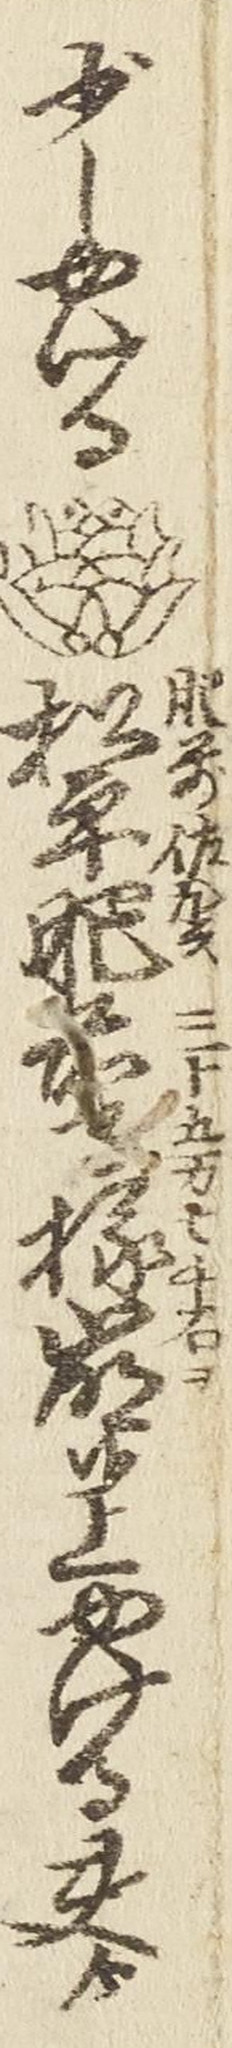少しやける松平肥前守様崩候上やける夫ゟ
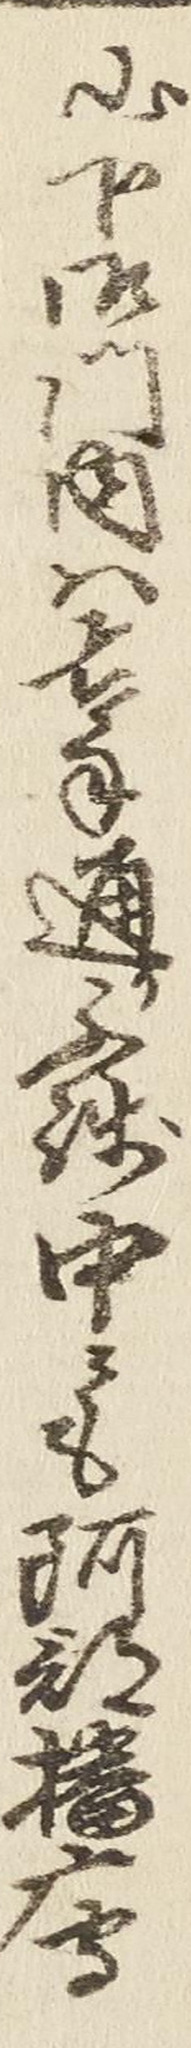山下御門内は土手通り不残中ニも阿部播磨守
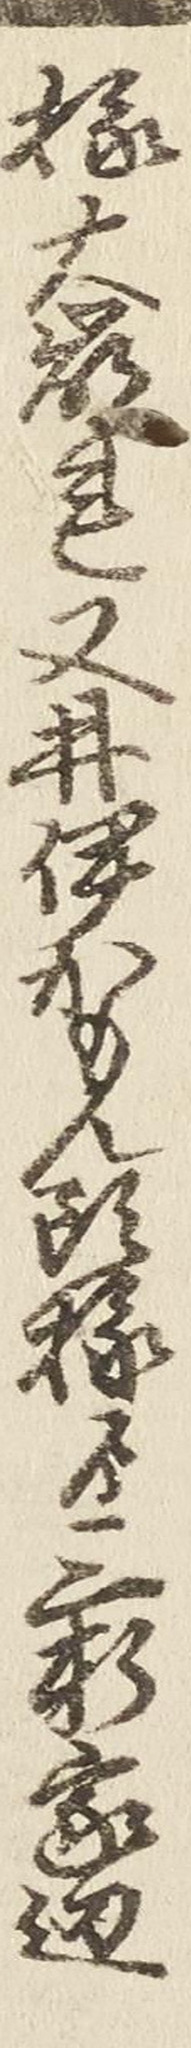様大崩れ又井伊かもん頭様ゟ三軒家辺
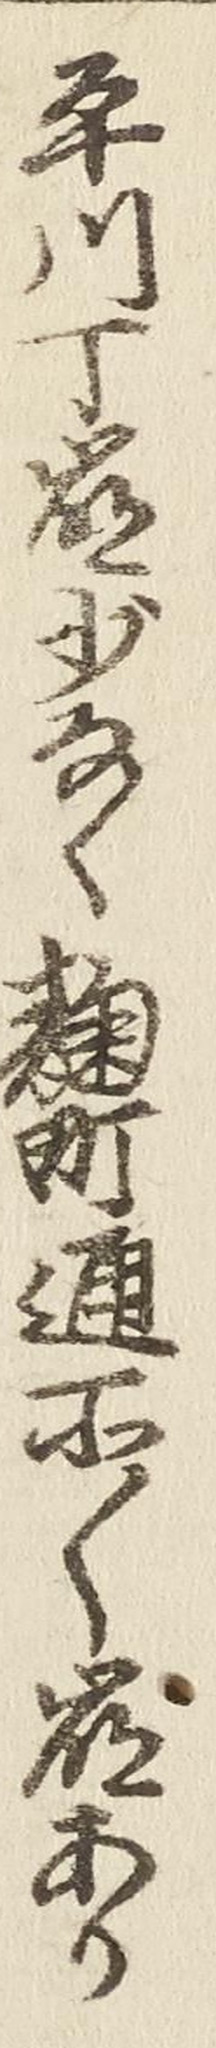平川丁崩少なく麹町通所〳〵崩あり
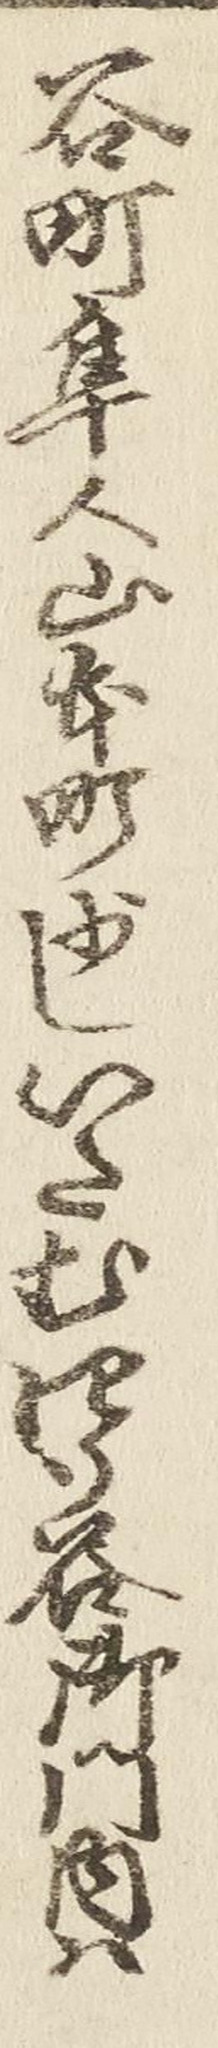谷町隼人山本町少しいたむ四ツ谷御門内は
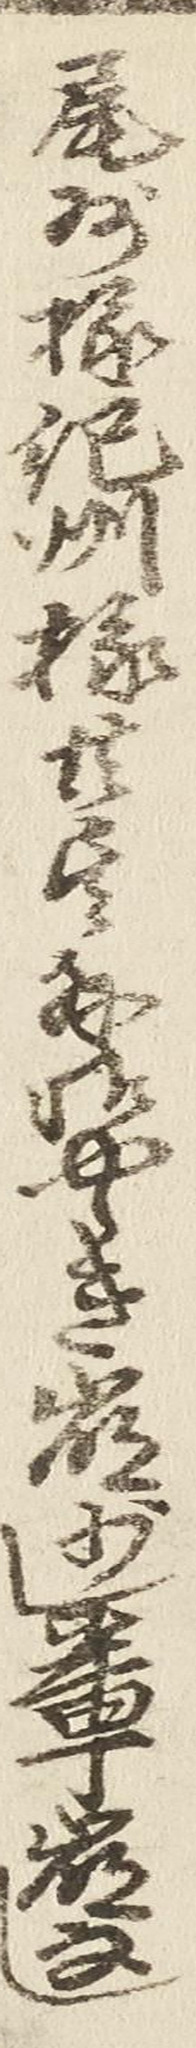尾州様紀州様共其外御やしき崩少し番丁崩なし
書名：江戸みやげ
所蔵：東京大学地震研究所図書室 Earthquake Research Institute Library, The University of Tokyo, JAPAN
